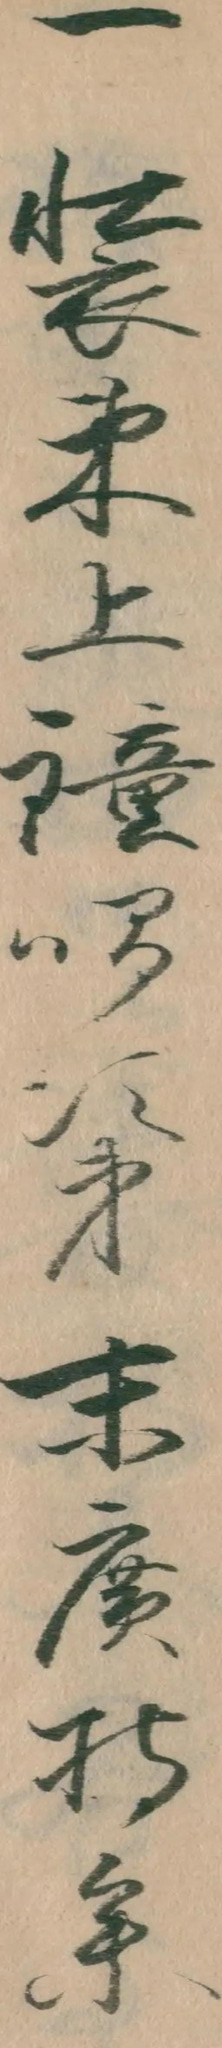一装束上鐘鳴次第末廣持参
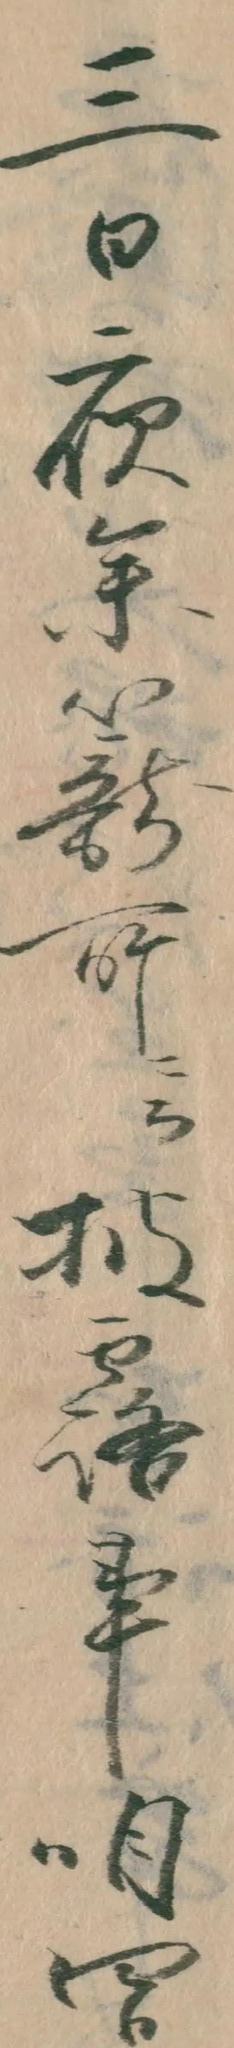一三日夜参籠所ニ而披露事明四日
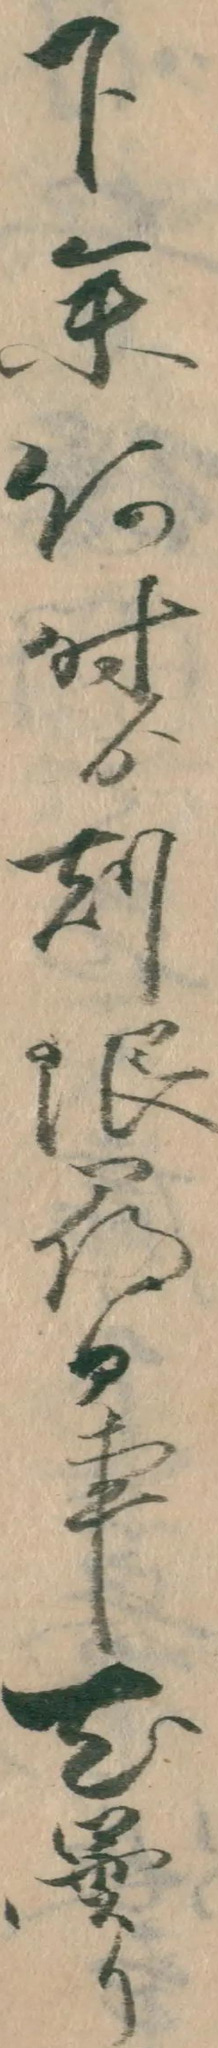下参何時ゟ刻限尋る事最曇り
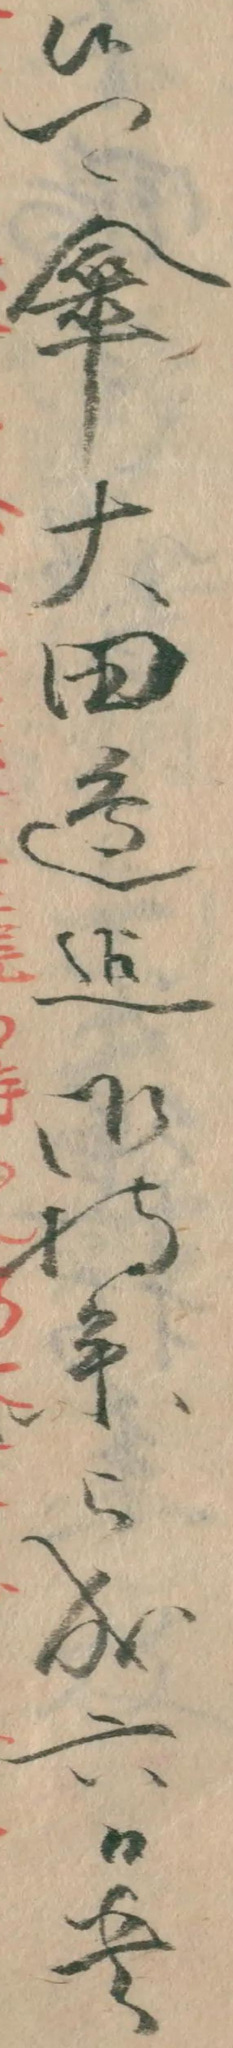候ハゝ傘大田辺迄御持参被成六日貴
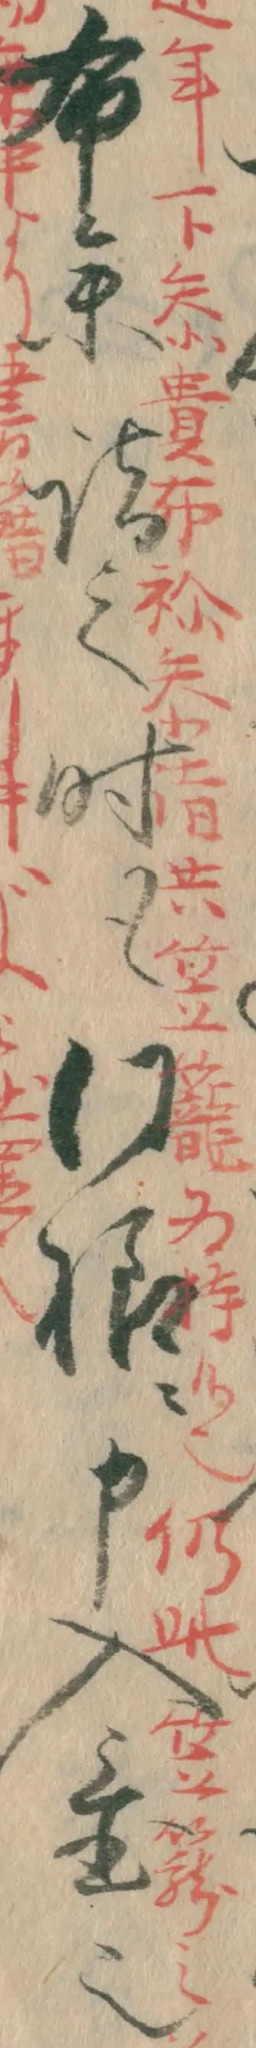布参詣之時も同様ニ申入置也
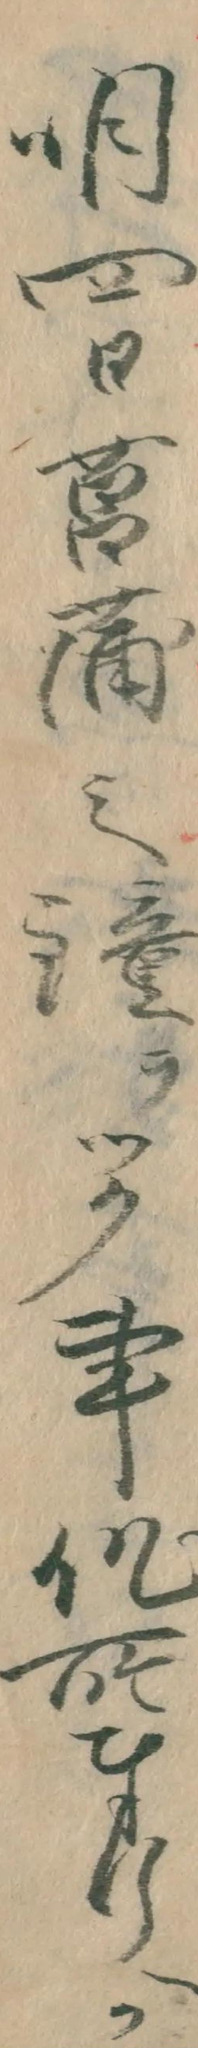明四日菖蒲之鐘ヲツク事作所奉行へか

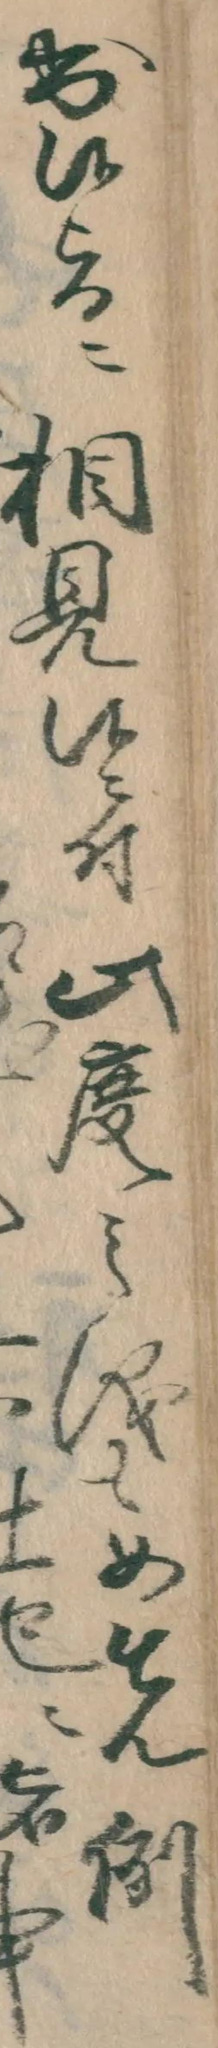出候旨ニ相見候ニ付此度之儀も如先例
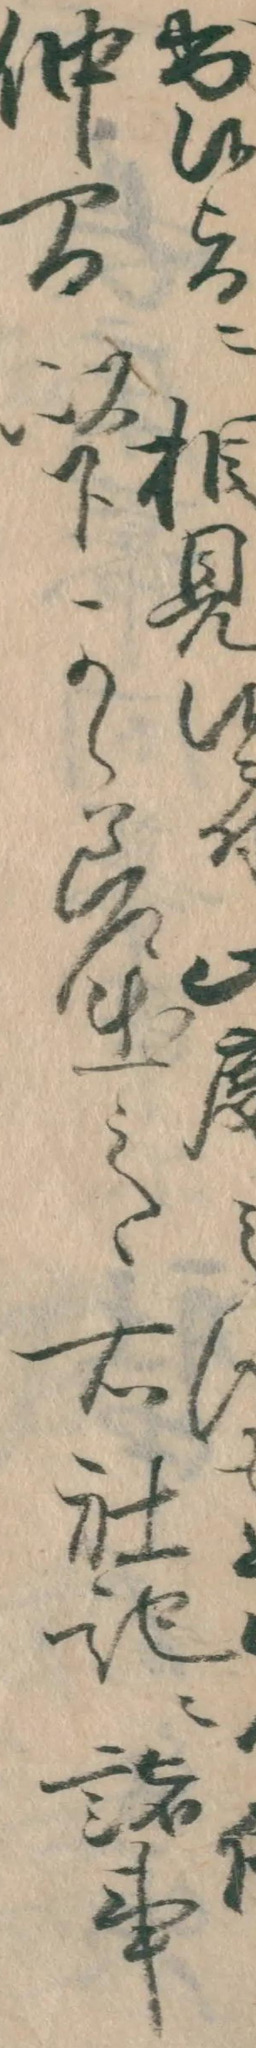仲間以下可差出之候右社記ニ諸事
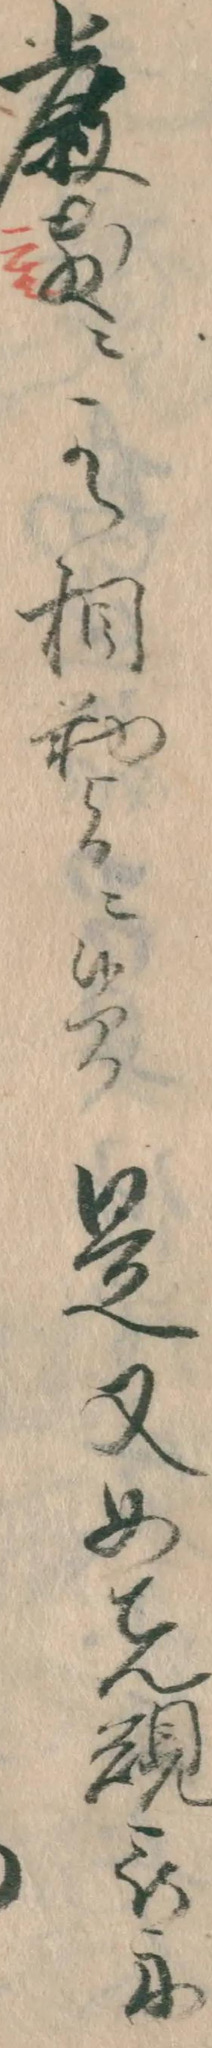厳敷ニ可相勤旨ニ候間是又如先規被示
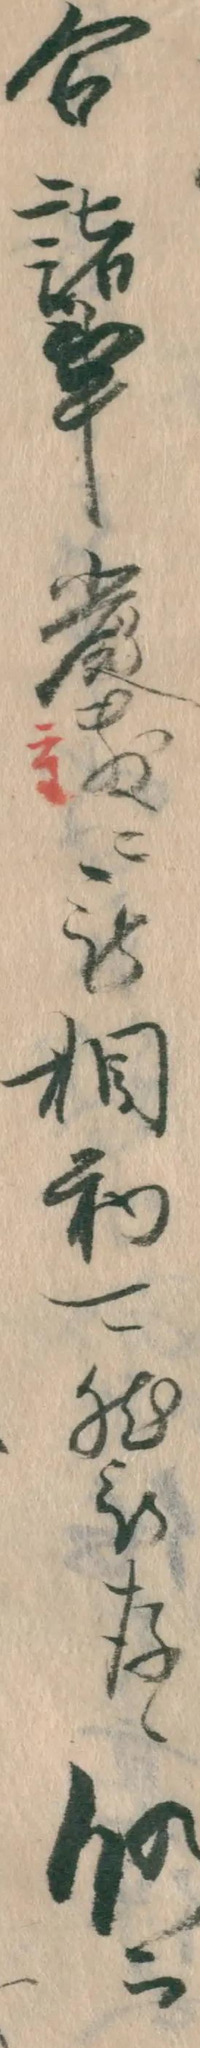合諸事厳敷ニ被相勤可然被存候仍而
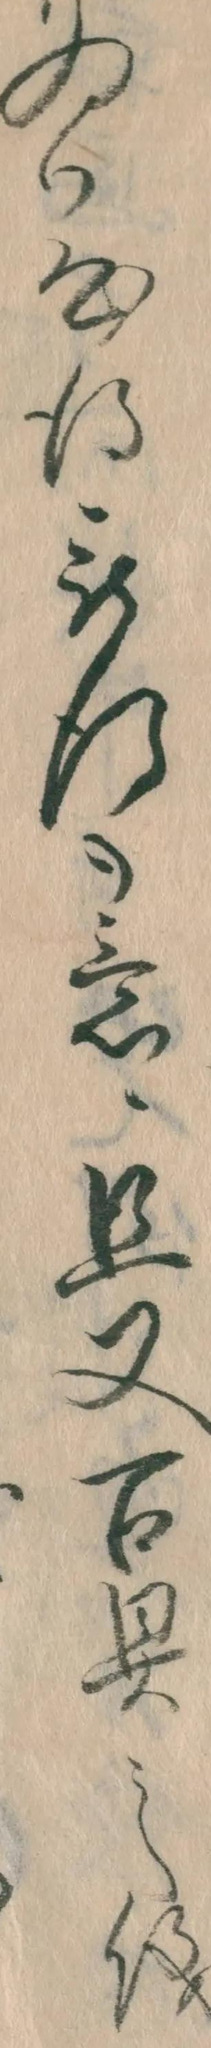為御心得被得御意候且又召具之儀
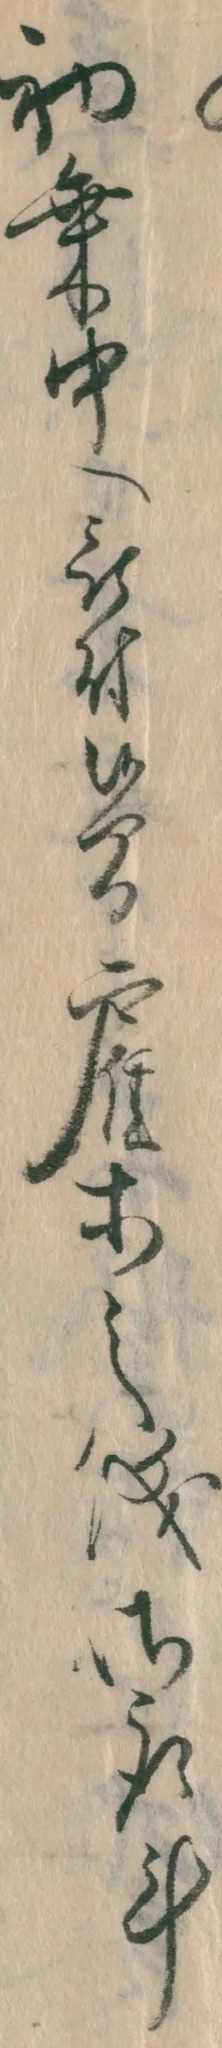初乗中へ被付候間雇等之儀御取計
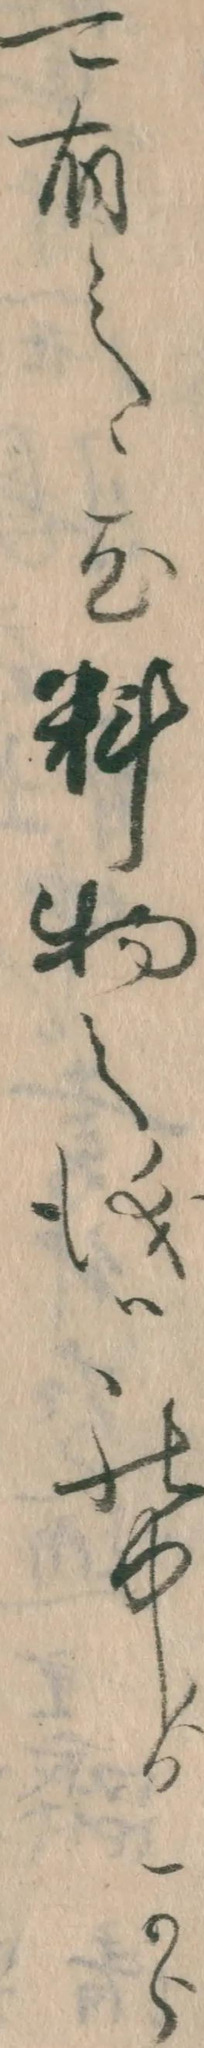可有之候尤料物之儀ハ社中ゟ可被
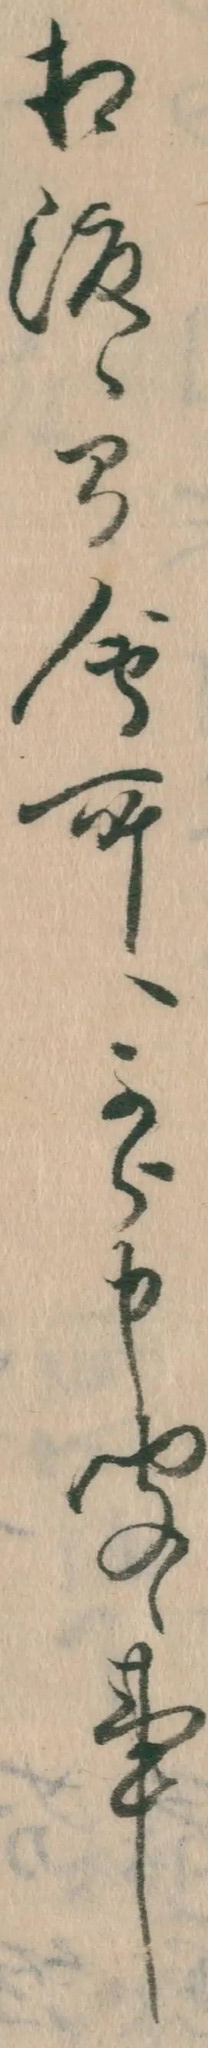相渡候間会所へ可被申聞候事
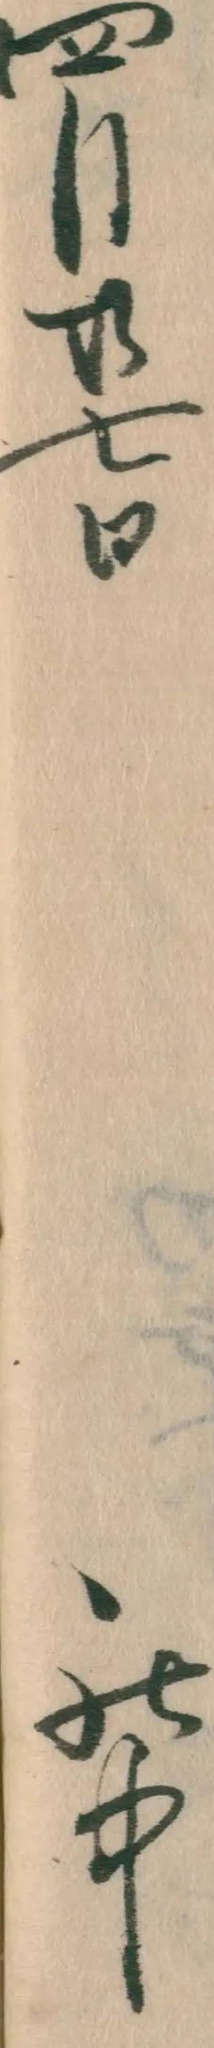四月廿七日社中
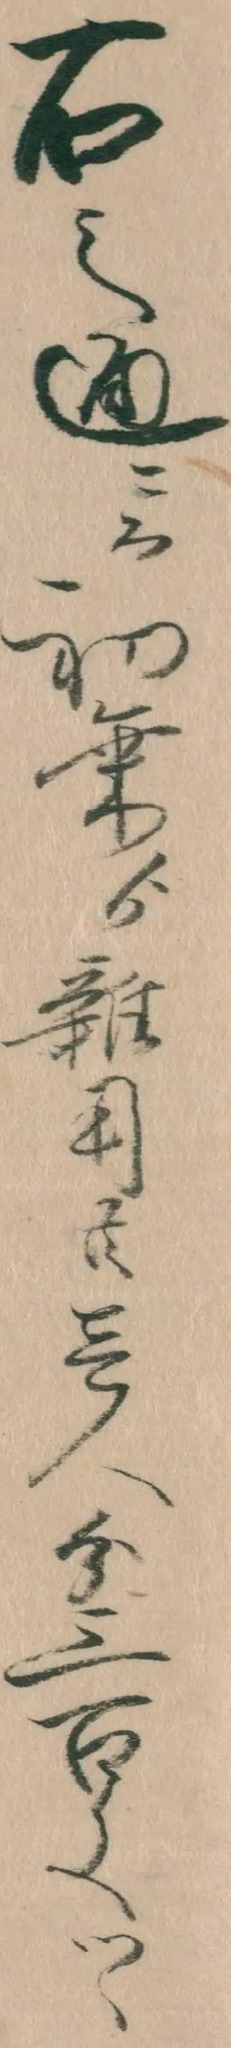右之通ニ而初乗ゟ雑用共壱人分三百文ツヽ
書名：賀茂社記録. 第11冊
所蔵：国立国会図書館 National Diet Library, JAPAN
